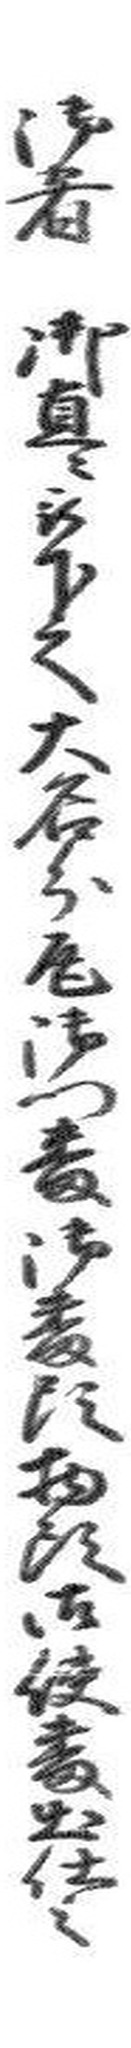御肴御直ニ被下之大名分瓦御門番御番頭物頭御使番出仕之
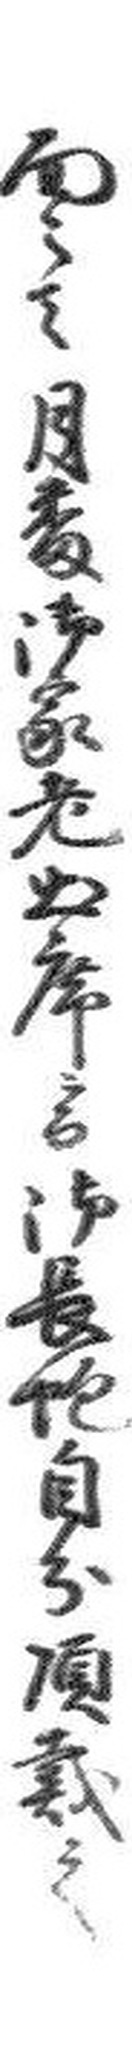面々者月番御家老出席ニ而御長蚫自分頂戴之
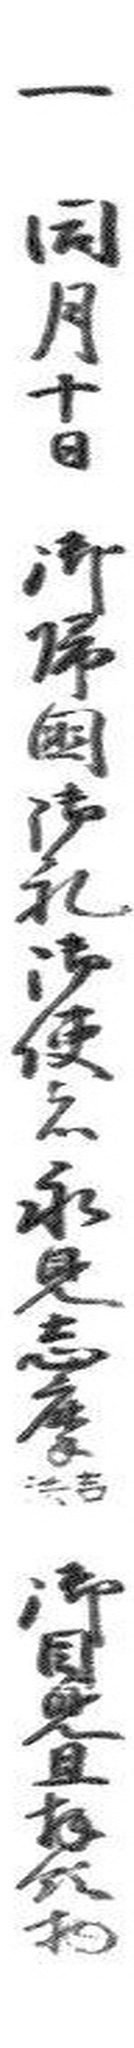一同月十日御帰国御礼御使者永見志摩吉洪御目見且拝領物
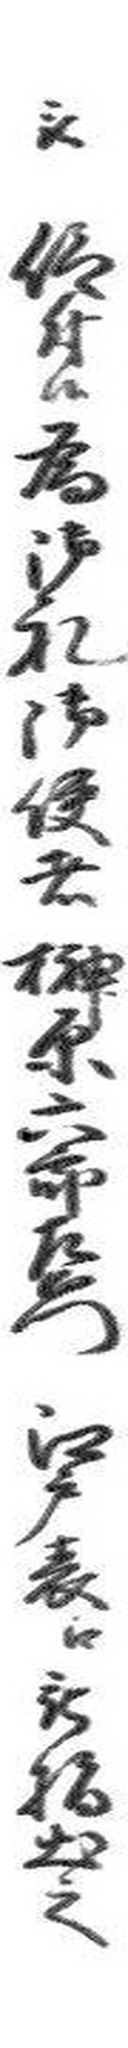被仰付候為御礼御使者榊原六郎左衛門江戸表江被指出之
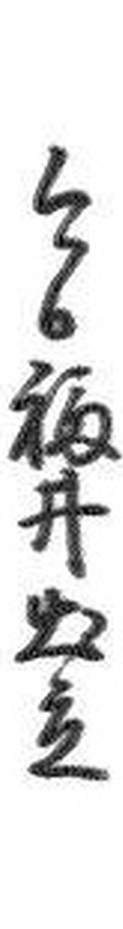今日福井出立
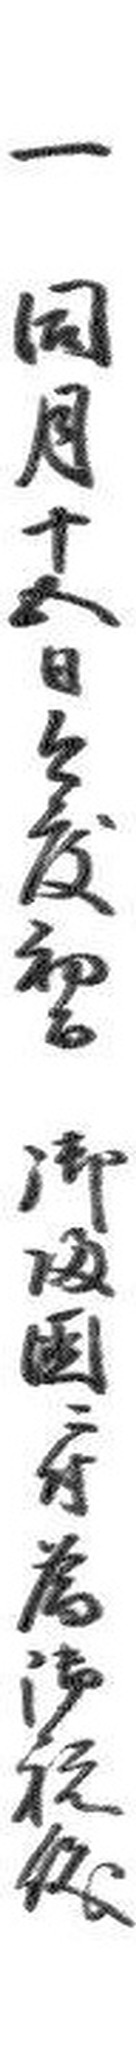一同月十五日今度初而御帰国ニ付為御祝儀
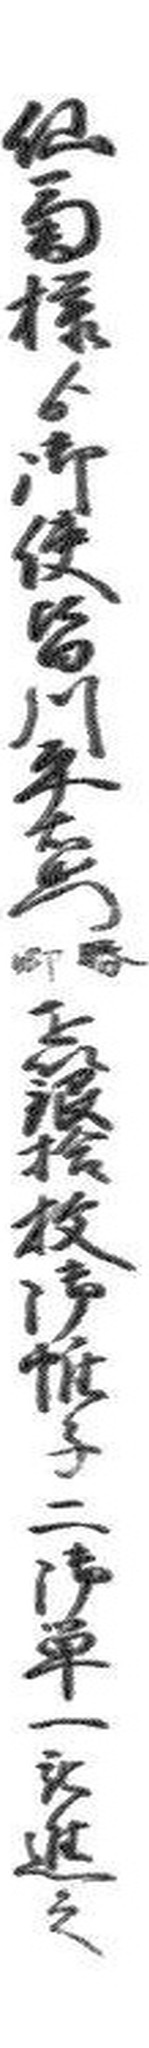仙菊様ゟ御使皆川平右衛門勝郷を以銀拾枚御帷子二御単一日進之
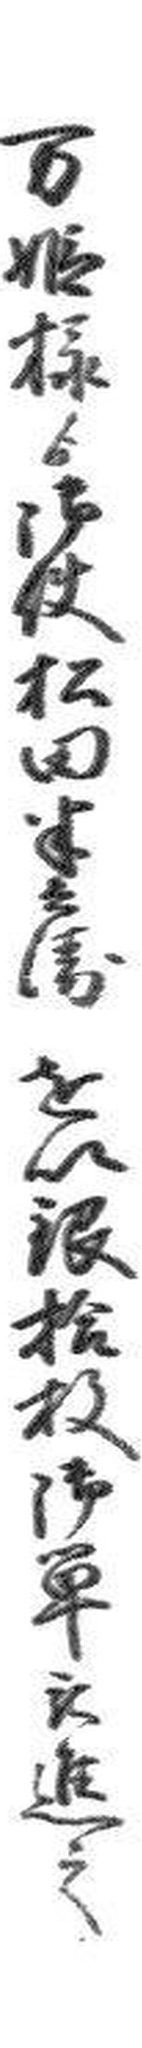万姫様ゟ御使松田半兵衛を以銀拾枚御単被進之

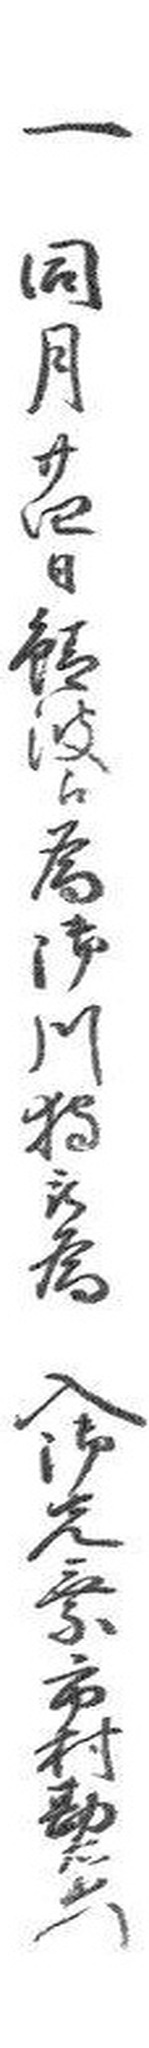一同月二十四日鯖波江為御川狩被為入御先乗市村勘右衛門
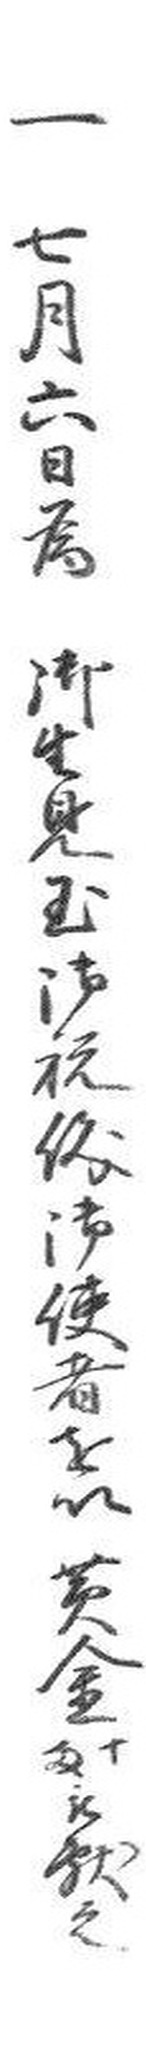一七月六日為御生身魂御祝儀御使者を以黄金十両被献之
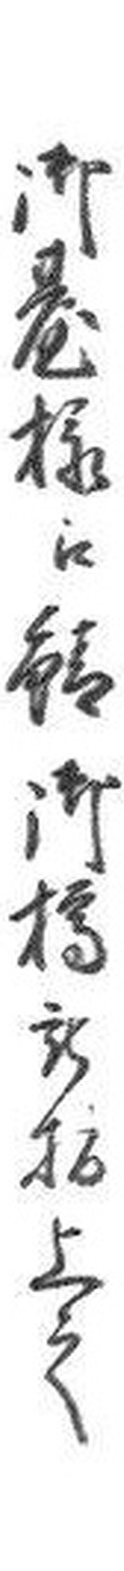御台様江鯖御樽被指上之
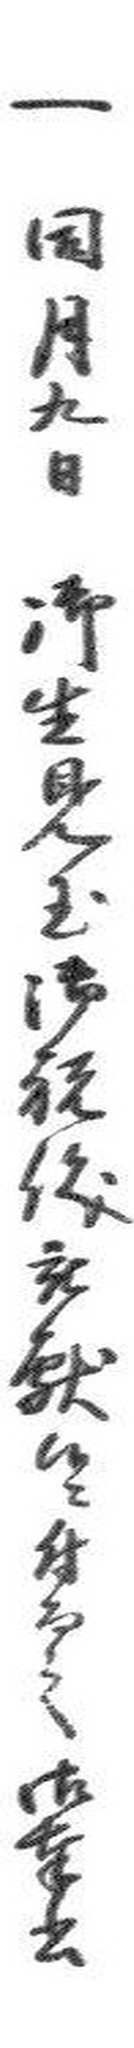一同月九日御生身魂御祝儀被献候ニ付而之御奉書
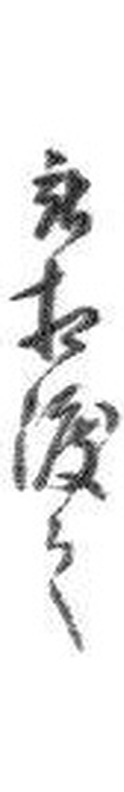被相渡之
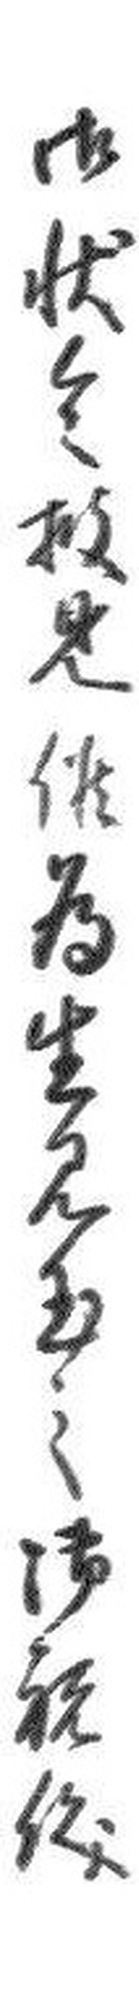御状令披見候為生身魂之御祝儀
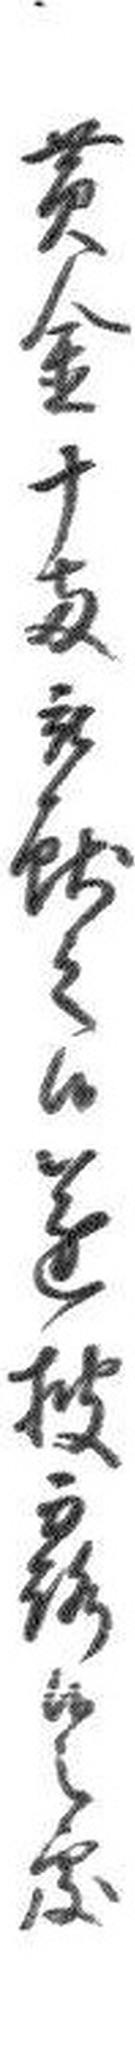黄金十両被献之候遂披露候之処
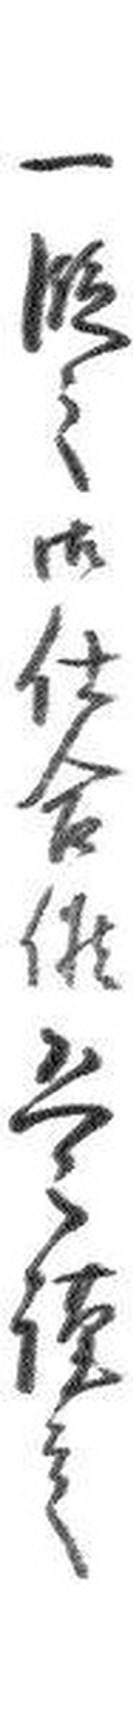一段之御仕合候恐々謹言
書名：家譜 十一 昌親公 従延宝二年到延宝四年八月
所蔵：福井県文書館 Fukui Prefectural Archives
